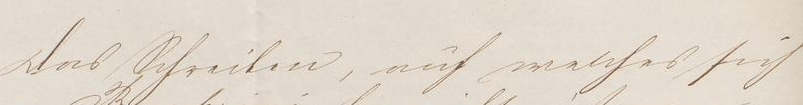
Das Schreiben, auf welches sich
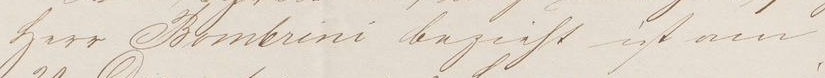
Herr Bombrini bezieht ist am
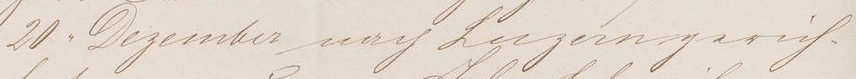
20t Dezember nach Luzern gerich-
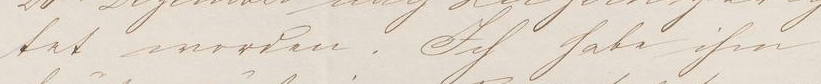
tet worden. Ich habe ihm
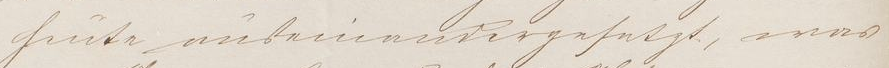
heute auseinandergesetzt, was
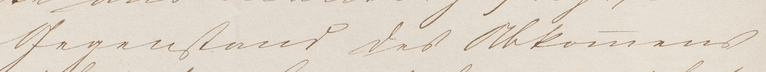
Gegenstand des Abkommens
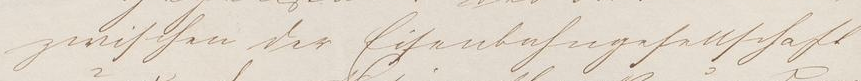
zwischen der Eisenbahngesellschaft
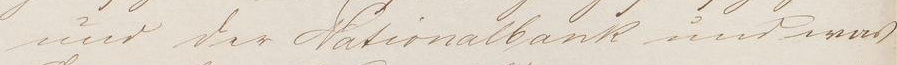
und der Nationalbank und was
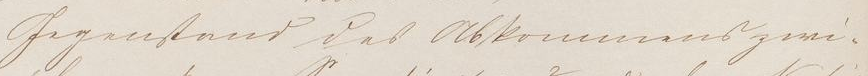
Gegenstand des Abkommens zwi-
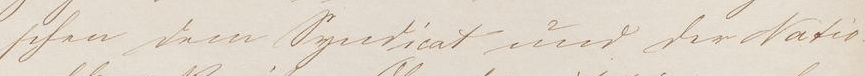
schen dem Syndicat und der Natio-
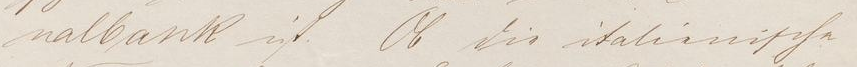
nalbank ist. Ob die italienische
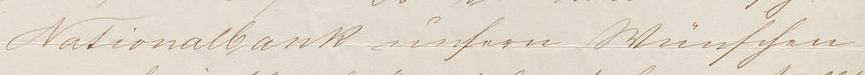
Nationalbank unsern Wünschen
